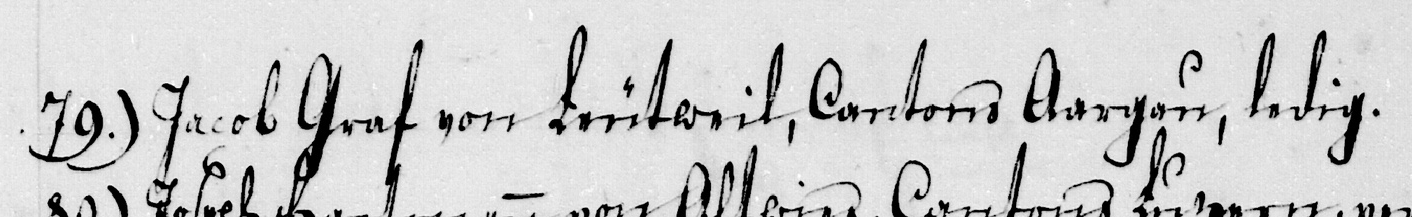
79.) Jacob Graf von Leutweil, Cantons Aargau, ledig.
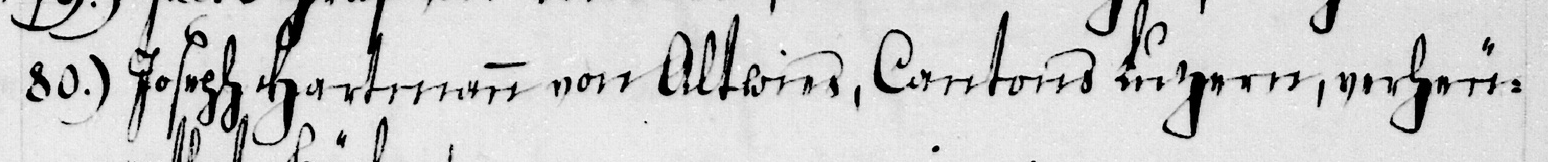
80.) Joseph Hartmann von Altwies, Cantons Luzern, verheu¬
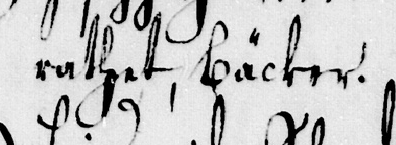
rathet, Bäcker.
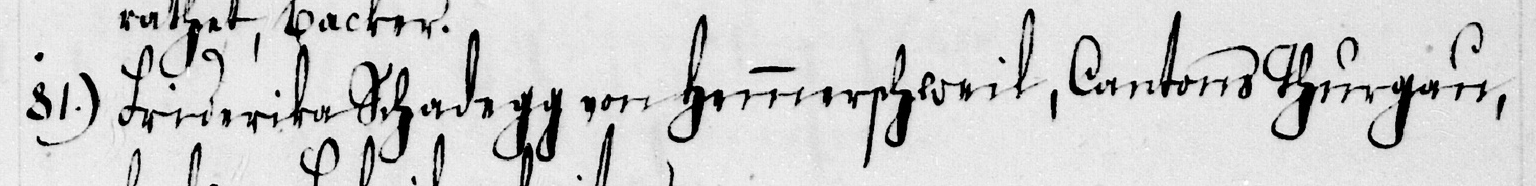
81.) Friderika Schadegg von Hemmerschweil, Cantons Thurgau,
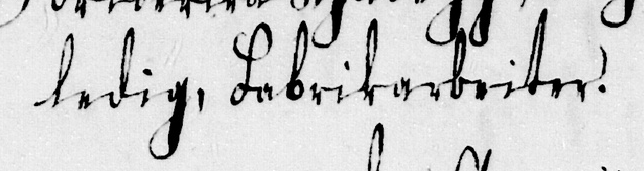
ledig, Fabrikarbeiter.
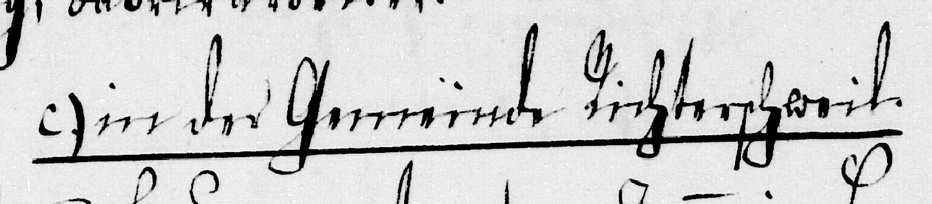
c.) in der Gemeinde Richterschweil.
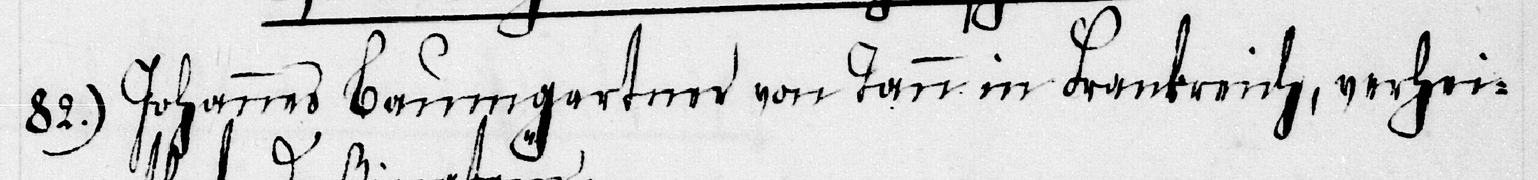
82.) Johannes Baumgartner von Tann in Frankreich, verhei¬
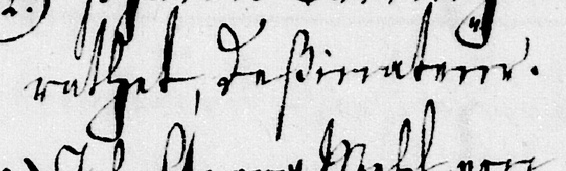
rathet, Deßinateur.
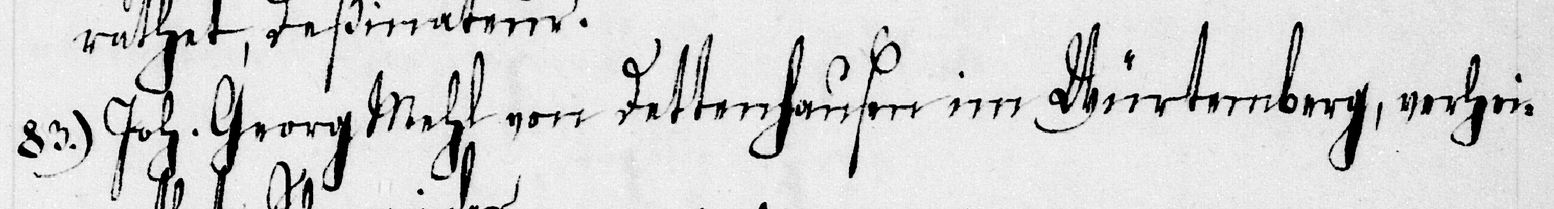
83.) Joh. Georg Mehl von Dettenhausen im Würtemberg, verhei¬
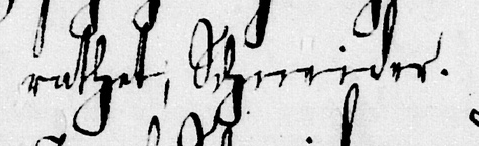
rathet, Schneider.
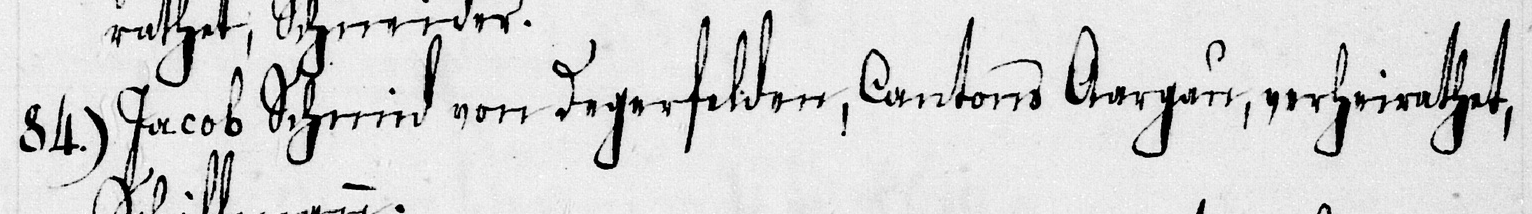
84.) Jacob Schmid von Degerfelden, Cantons Aargau, verheirathet,
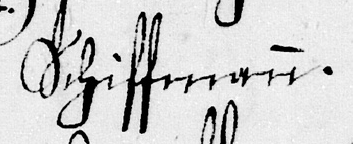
Schiffmann.
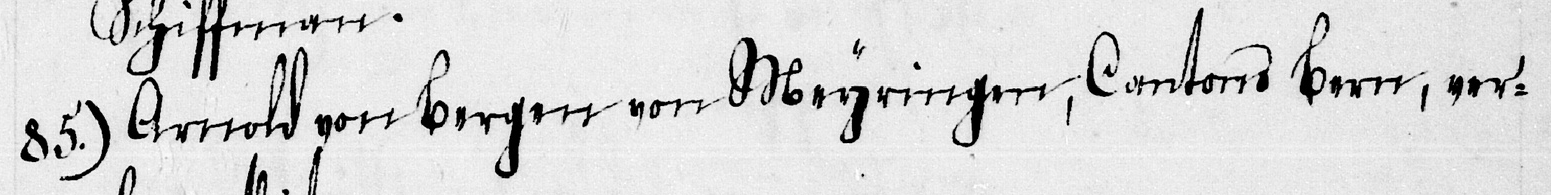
85.) Arnold von Bergen von Meyringen, Cantons Bern, ver¬
